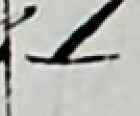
I42
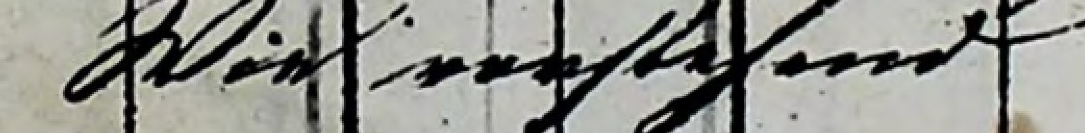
Wie vorstehend
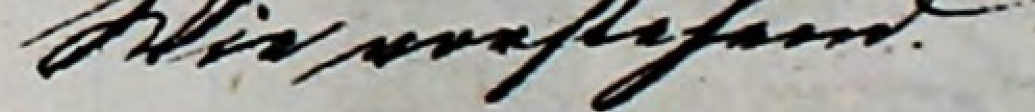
Wie vorstehend.
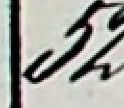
52
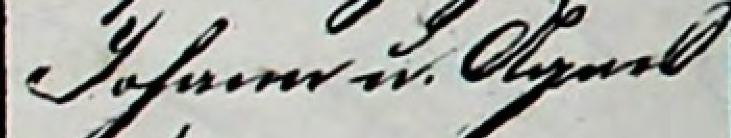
Johann u. Agnes
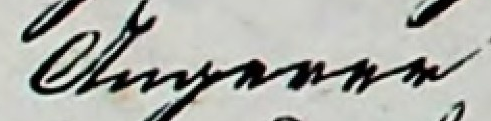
Angerer
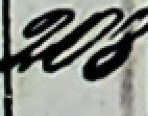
208
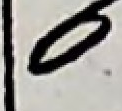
6
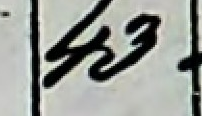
43
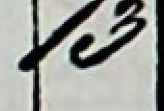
13
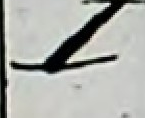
I
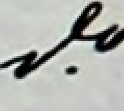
do
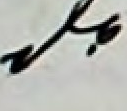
do
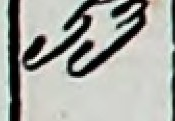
53
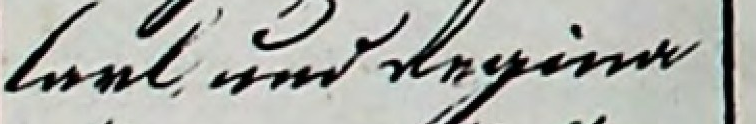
Carl und Regina
